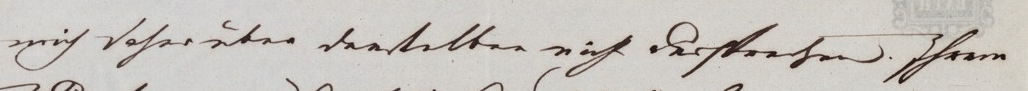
mich daher über denselben nicht aussprechen. Ihrem
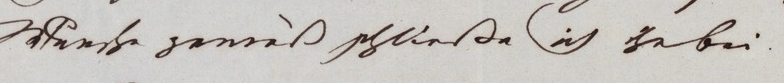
Wunsche gemäß schließe ich ihn bei.
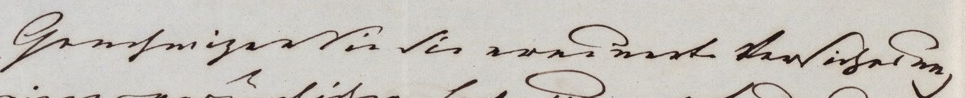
Genehmigen Sie die erneuerte Versicherung
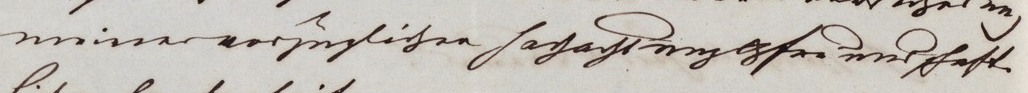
meiner vorzüglichen Hochachtung & freundschaft-
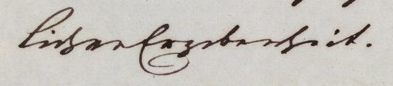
lichen Ergebenheit.
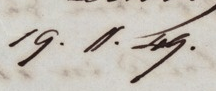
19. II. 49.
